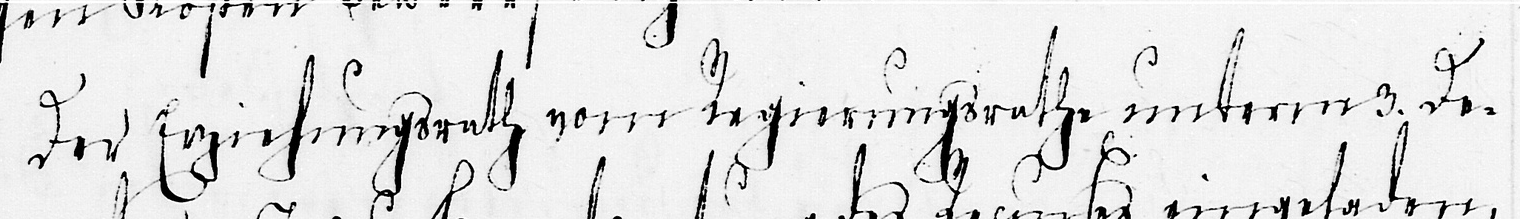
Der Erziehungsrath vom Regierungsrathe unterm 3. De¬
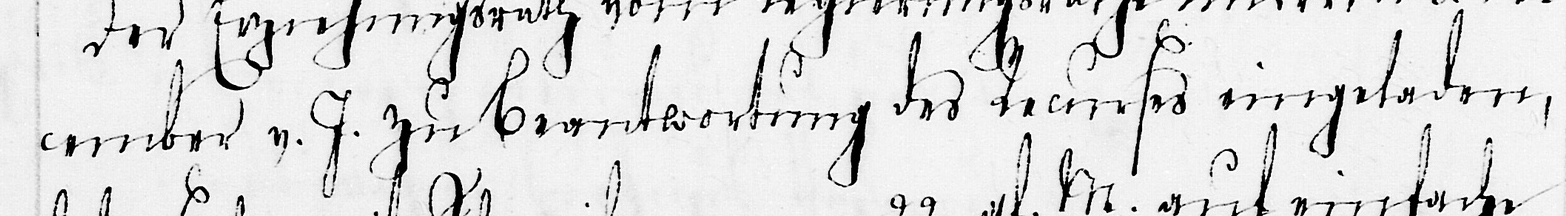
cember v. J. zu Beantwortung des Recurses eingeladen,
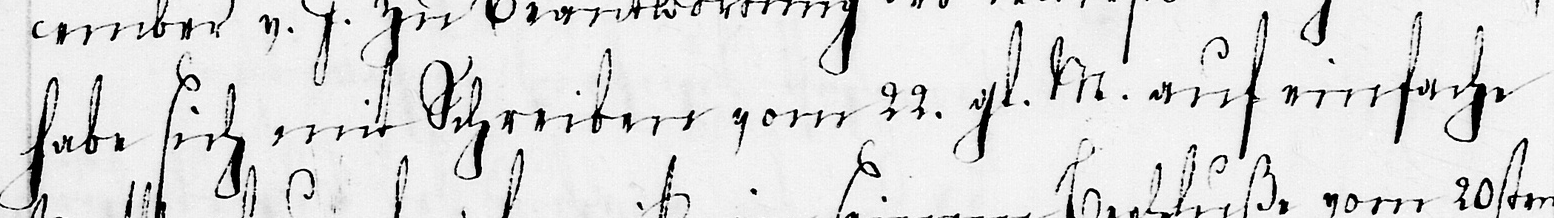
habe sich mit Schreiben vom 22. gl. M. auf einfache
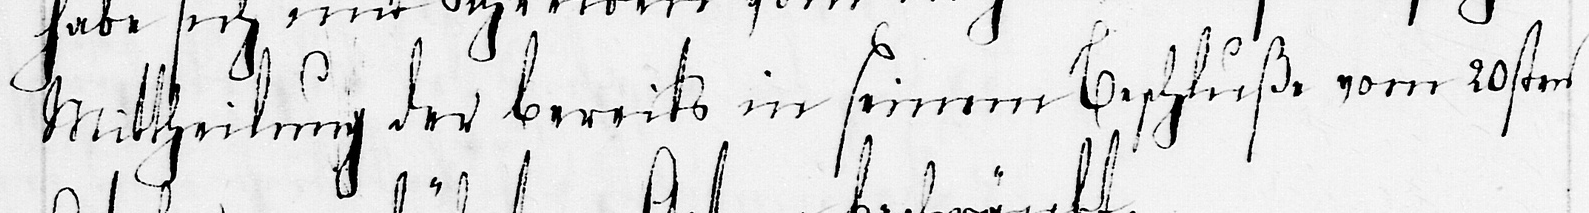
Mittheilung der bereits in seinem Beschluße vom 20sten
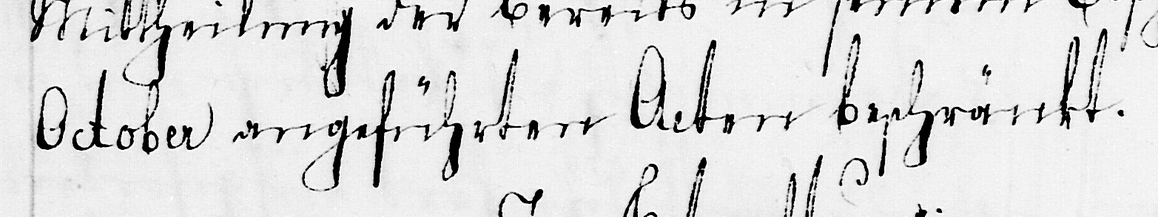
October angeführten Acten beschränkt.
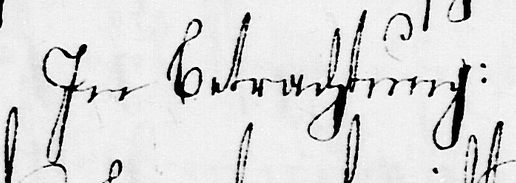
In Betrachtung:
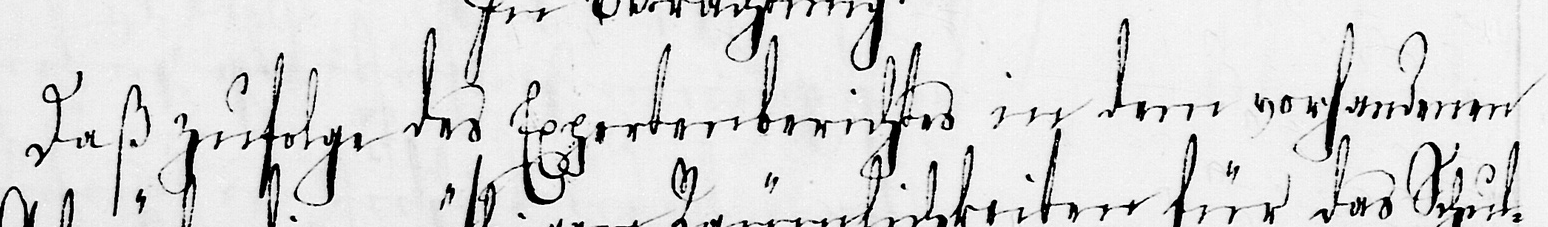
Daß zufolge des Expertenberichtes in dem vorhandenen
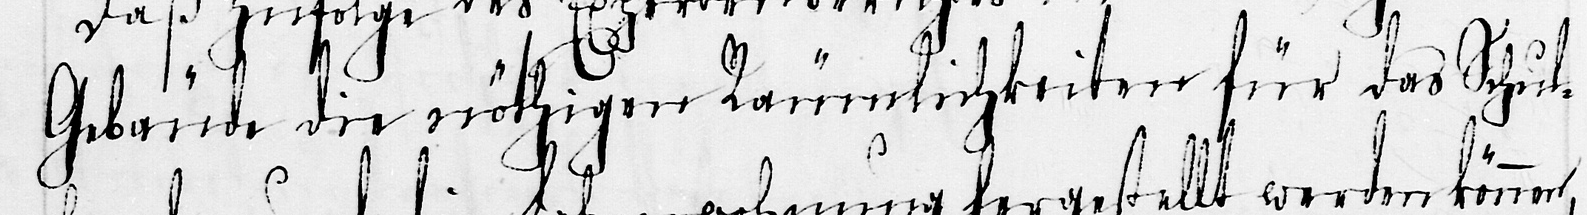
Gebäude die nöthigen Räumlichkeiten für das Schul¬
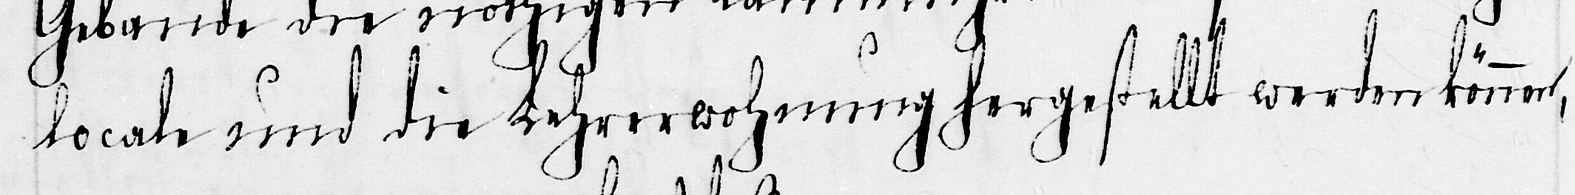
locale und die Lehrerwohnung hergestellt werden könne¬
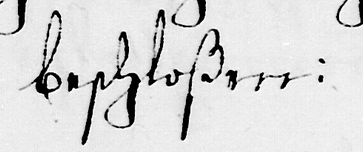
beschloßen:
